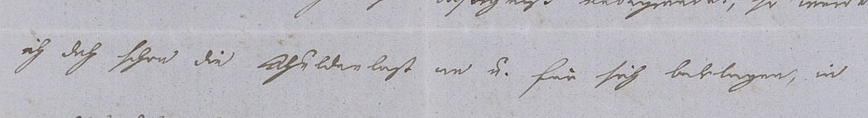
ich doch schon die Schuldenlast an u. für sich beklagen, in
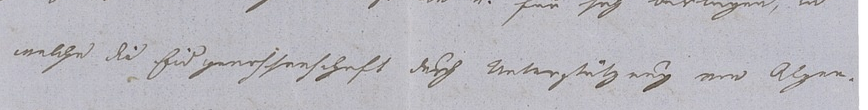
welche die Eidgenossenschaft durch Unterstützung von Alpen -
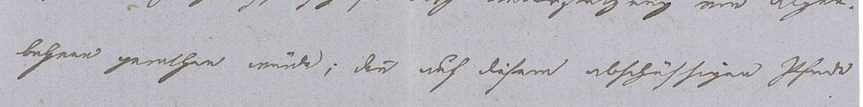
bahnen gerathen würde; denn auf diesem abschüssigen Pfade
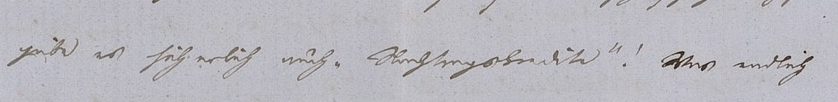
gäbe es sicherlich auch «Nachtragskredite»! Was endlich
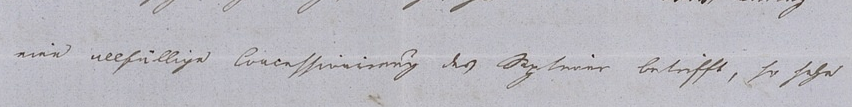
eine allfällige Concessionirung des Septimer betrifft, so sehe
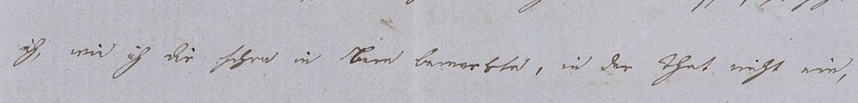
ich, wie ich Dir schon in Bern bemerkte, in der That nicht ein,
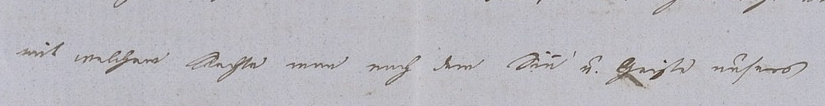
mit welchem Rechte man nach dem Sinn u. Geiste unseres
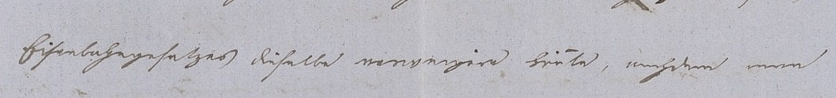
Eisenbahngesetzes dieselbe verweigern könnte, nachdem man
